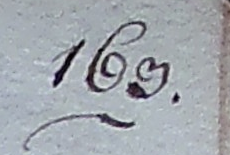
163.
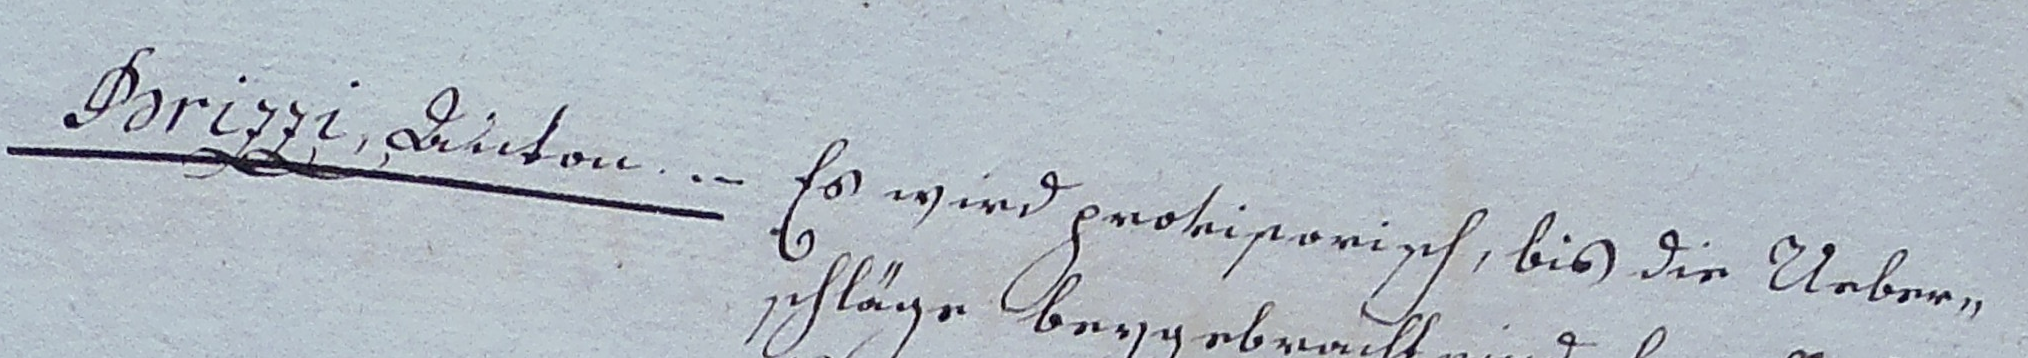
Brizzi, Anton. ... Es wird provisorisch, bis die Ueber¬
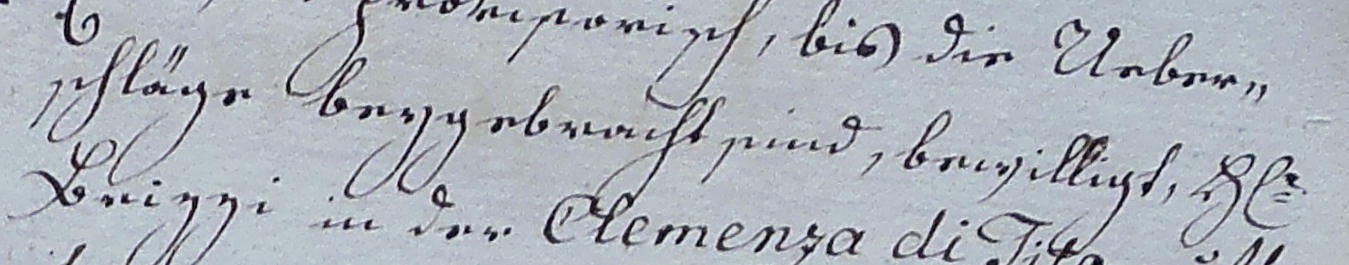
schläge beygebracht sind, bewilligt, HEr͇
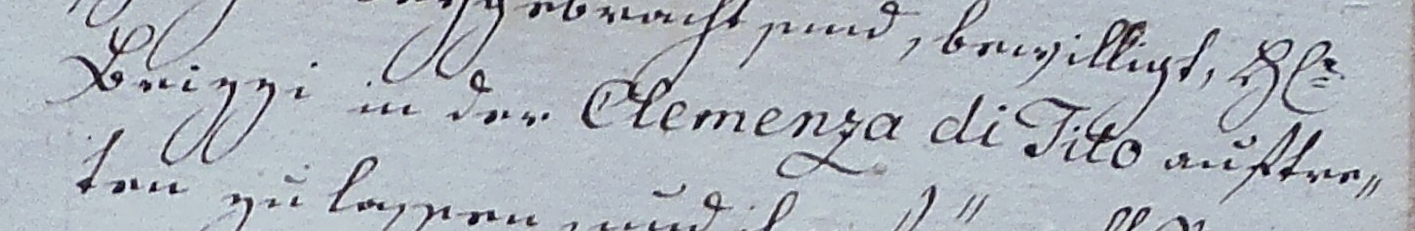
Brizzi in der Cemenza di Tito auftre¬
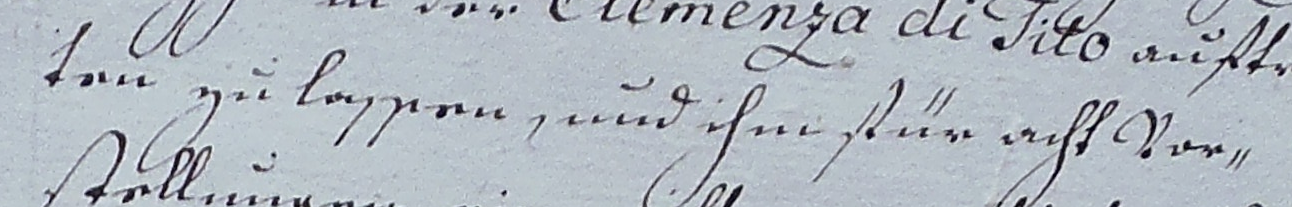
ten zu lassen, und ihm für acht Vor¬
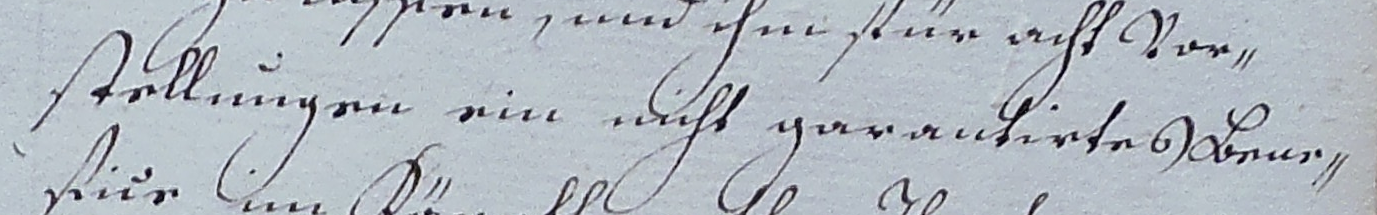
stellungen ein nicht garantirtes Bene¬
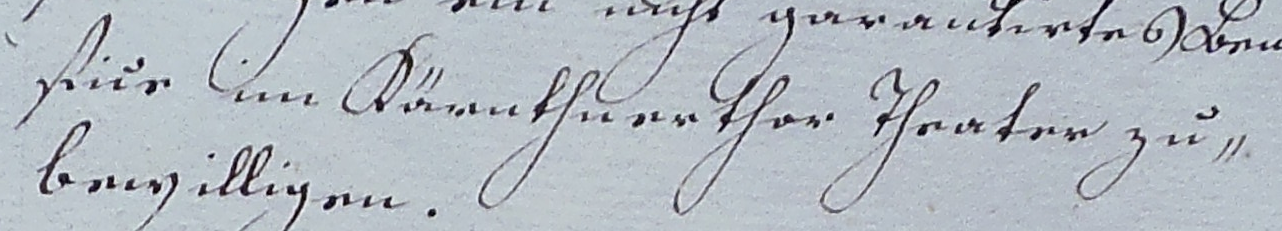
fice im Kärnthnerthor Theater zu¬
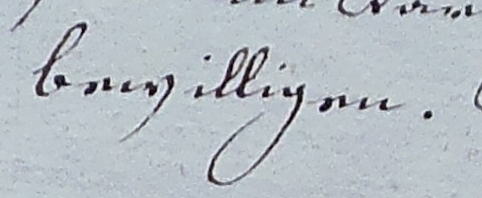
bewilligen.
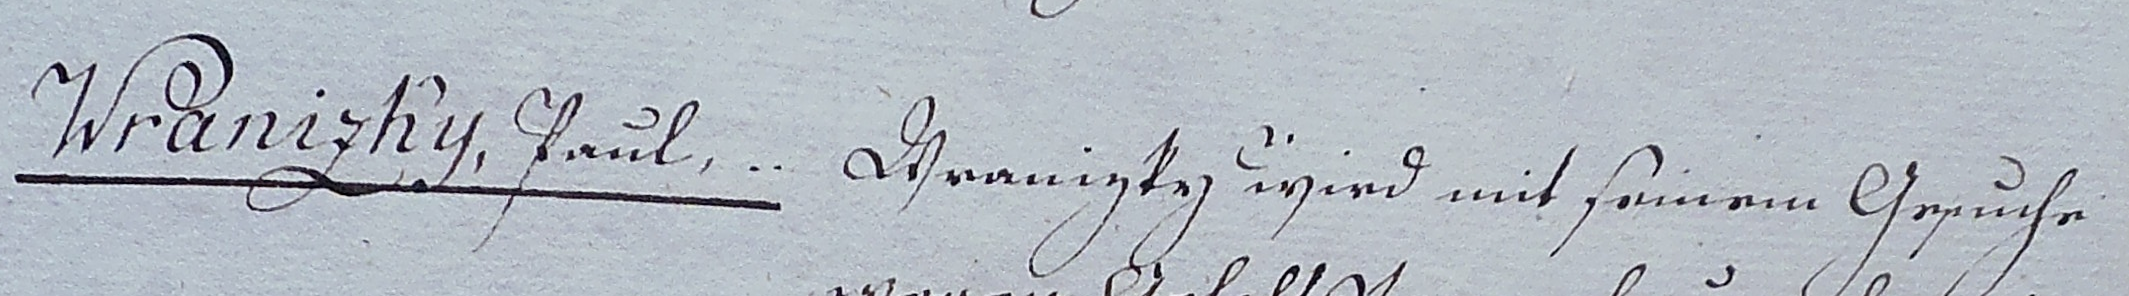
Wranizky, Paul, .. Wranizky wird mit seinem Gesuche
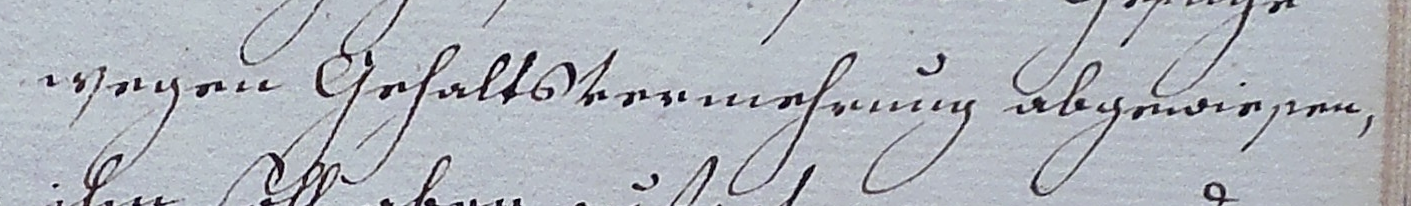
wegen Gehaltsvermehrung abgewiesen,
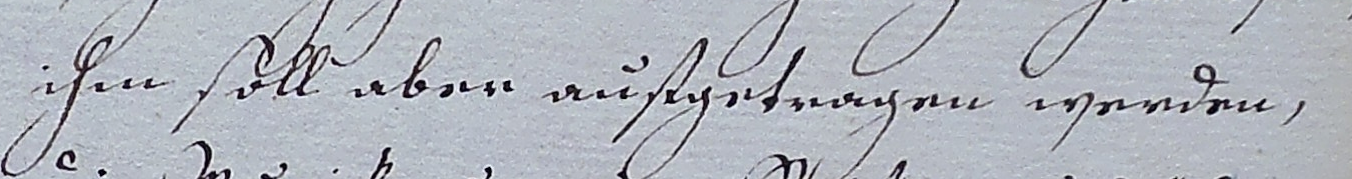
ihm soll aber aufgetragen werden,
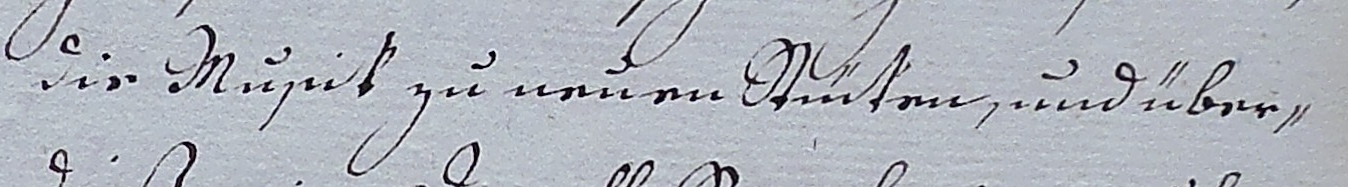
die Musik zu neuen Stücken, und über¬
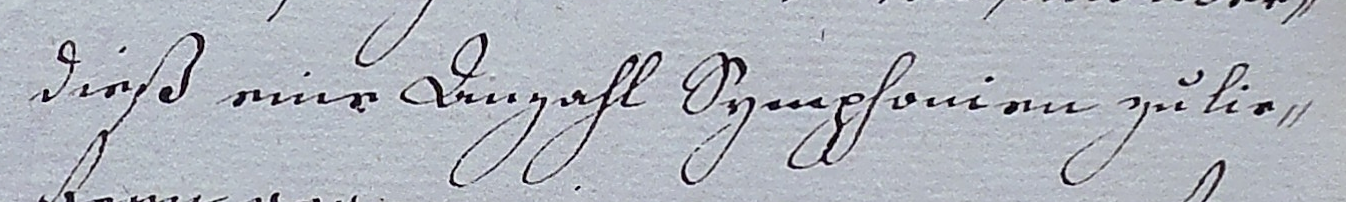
dieß eine Anzahl Symphonien zulie¬
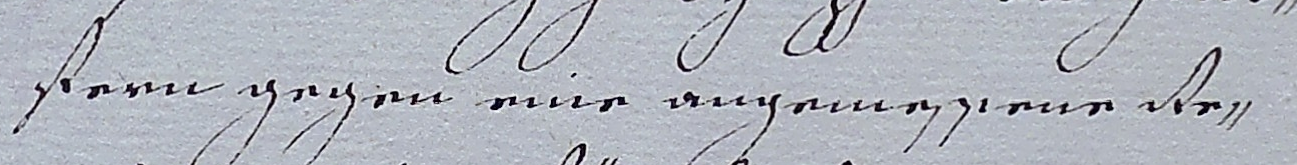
fern gegen eine angemessene Re¬
